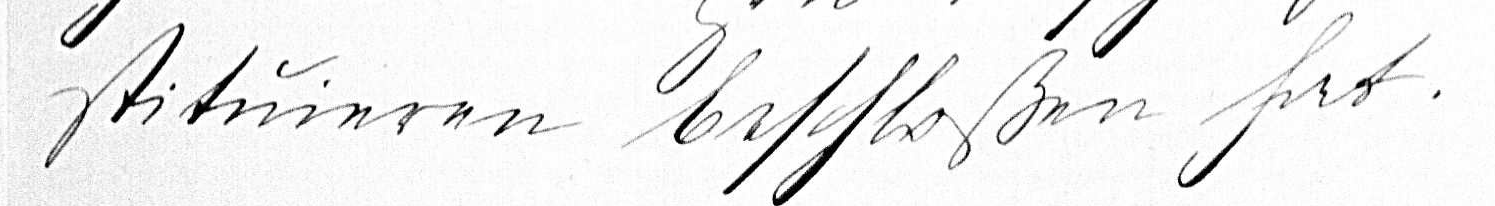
stituieren beschloßen hat.
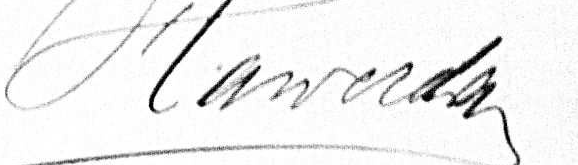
Hawerda
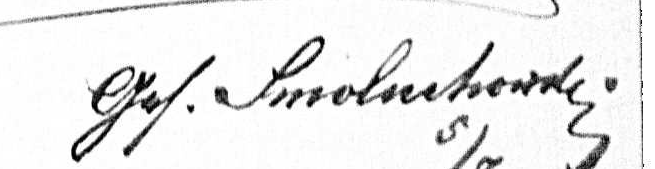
Ges. Smolnchowski
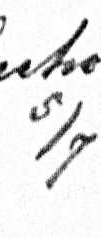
5/7
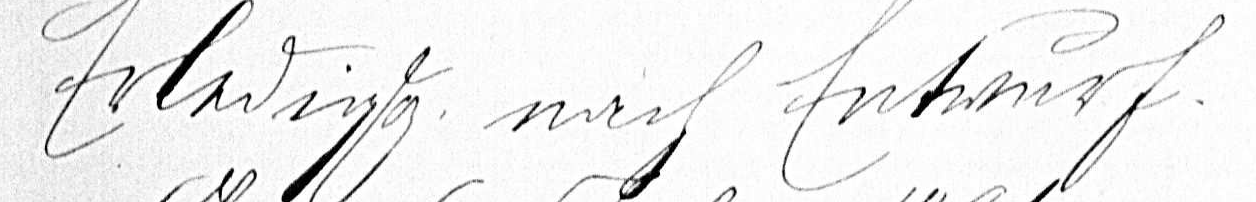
Erledigung nach Entwurf
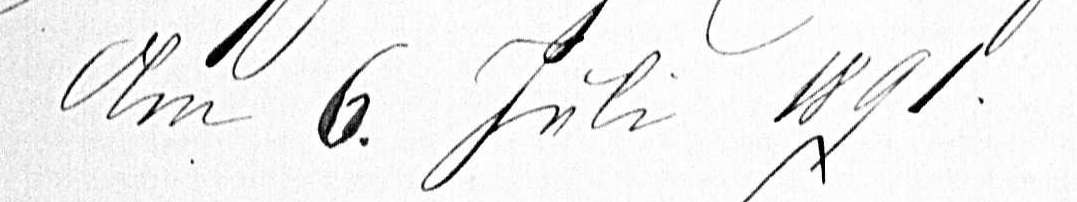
Am 6. Juli 1891
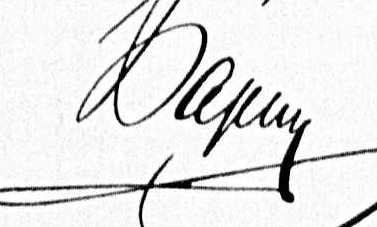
Baum
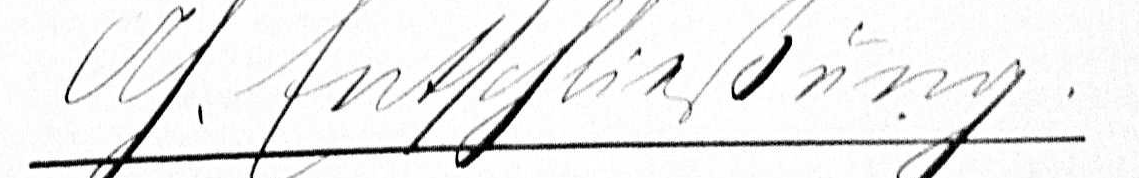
Ah Entschließung
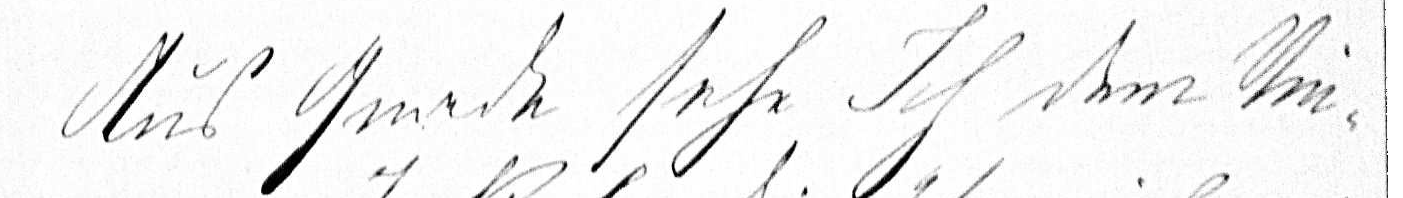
Aus Gnade sehe Ich dem Vin¬
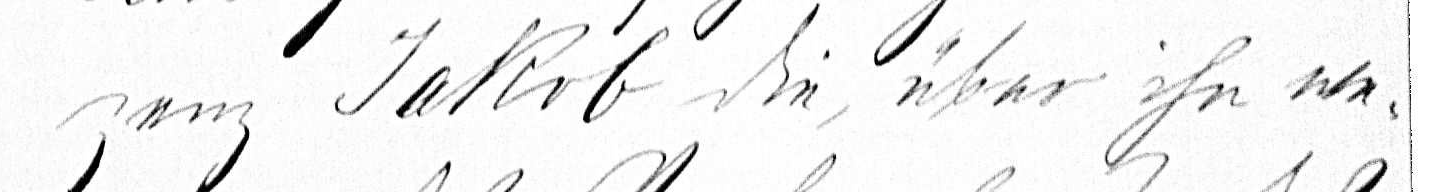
zenz Jakob die über ihn we¬
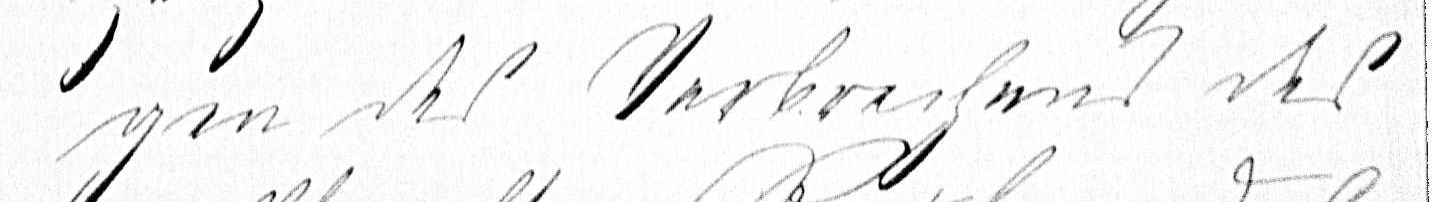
gen des Verbrechens des
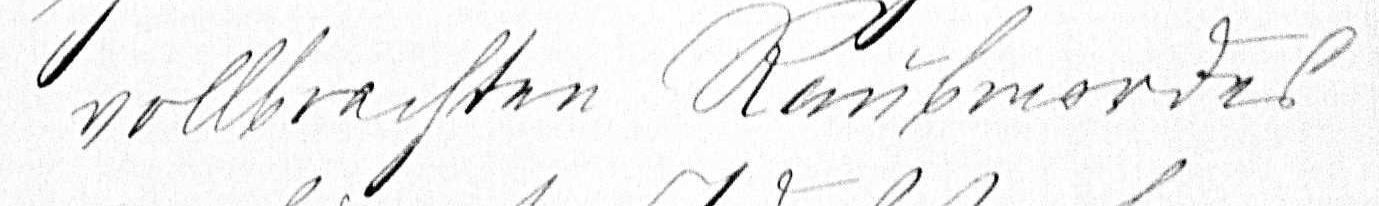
vollbrachen Raubmordes
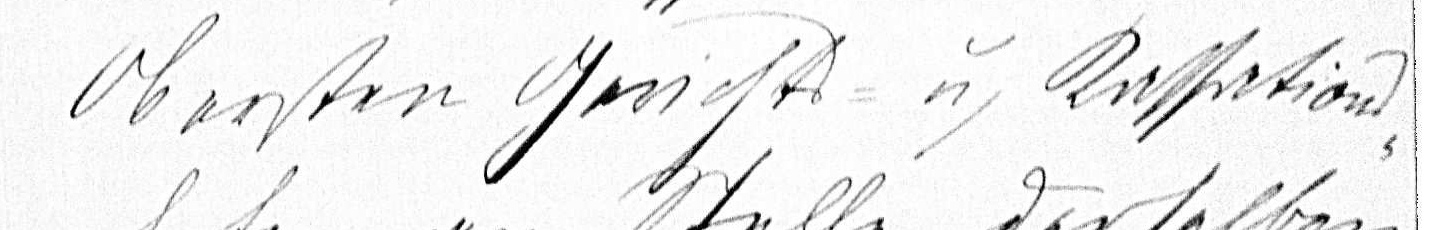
Obersten Gerichts- und Kassations¬
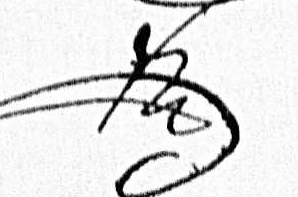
FJ
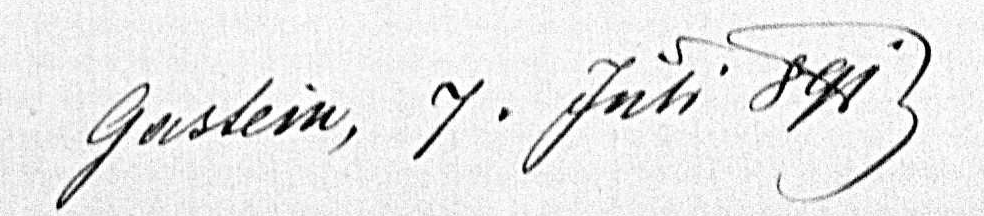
Gastein, 7 Juli 1891
